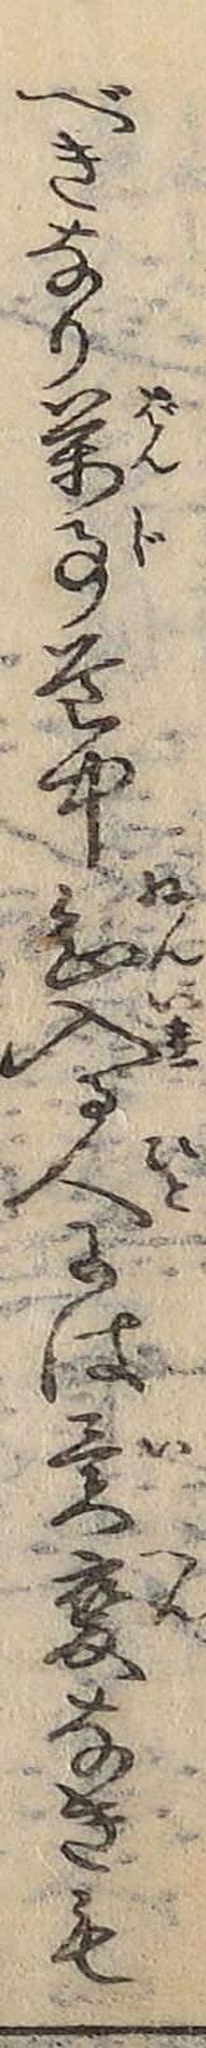べきなり万事道中念入る人には異変なきも
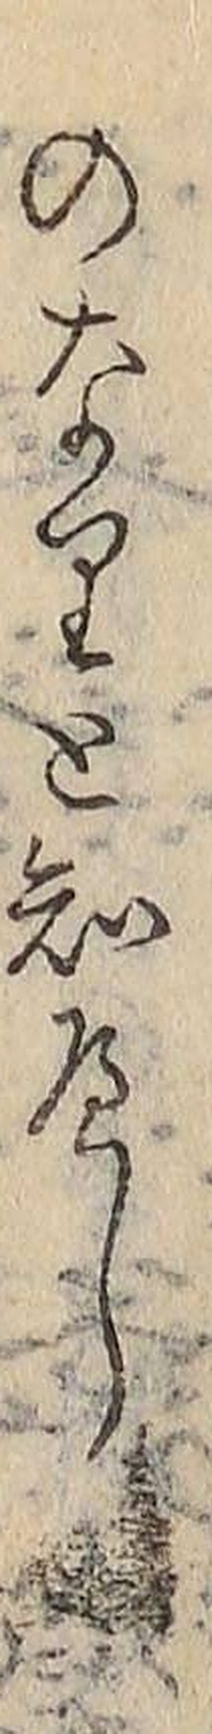のなりと知へし
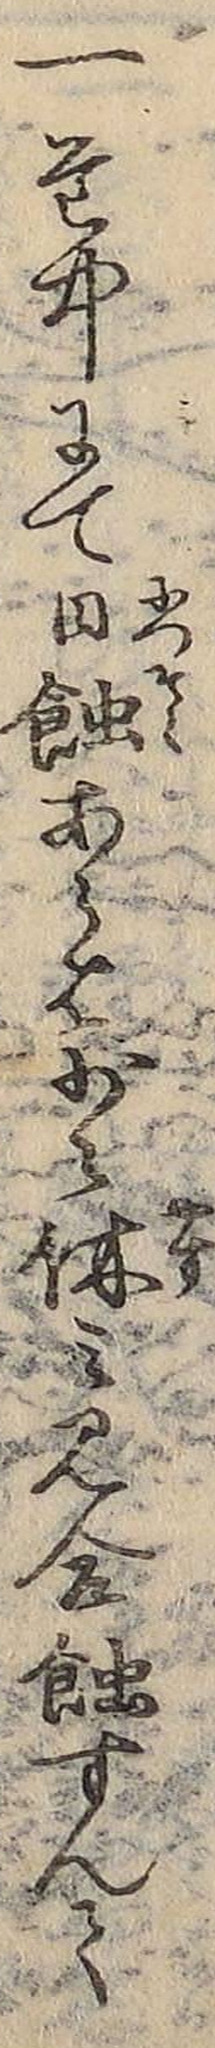一道中にて日蝕あらは少々休み見合蝕すんて
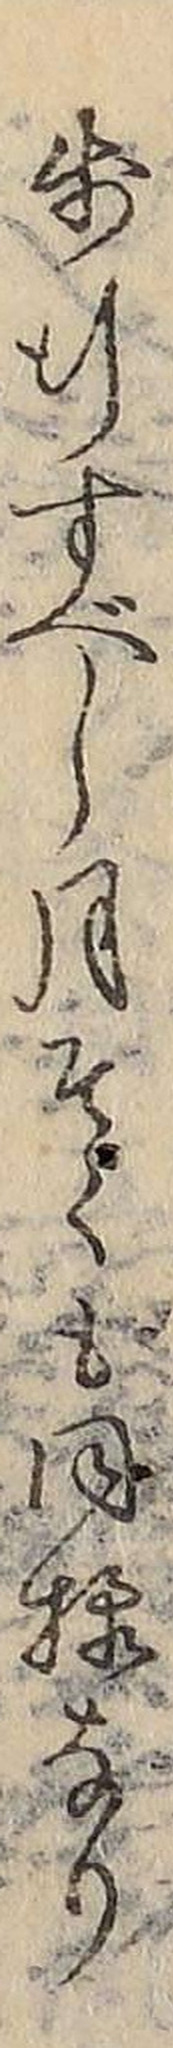歩行すべし月そくも同様なり
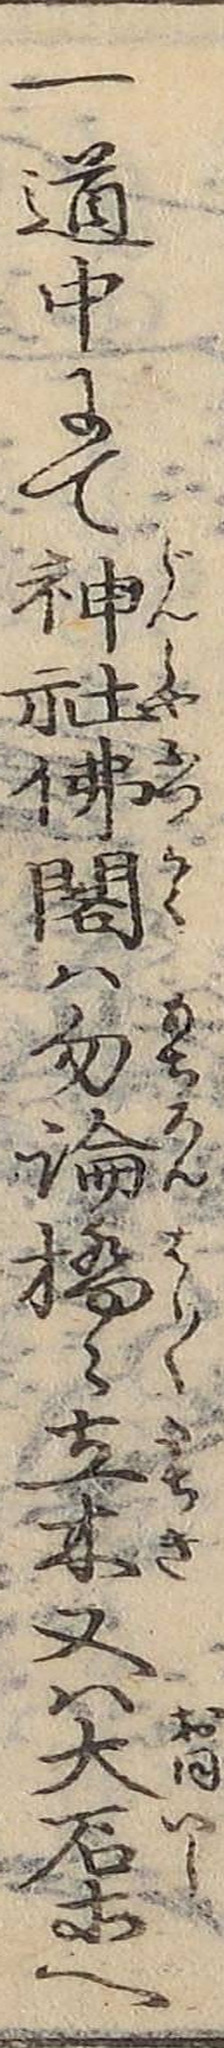一道中にて神社仏閣は勿論橋々立木又は大石等へ
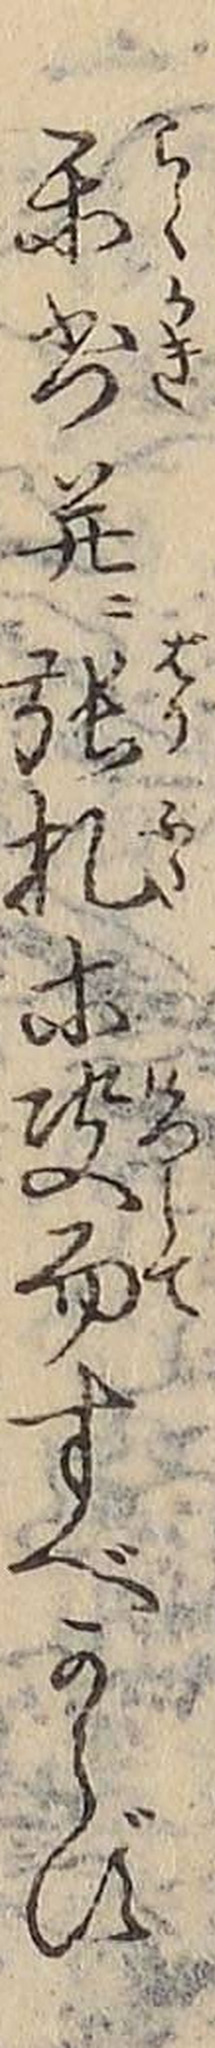楽書并張札等決而すべからず
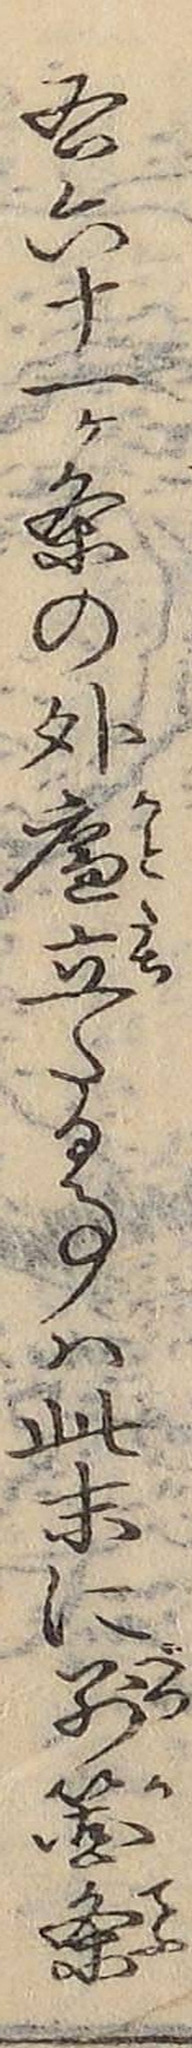右六十一ケ条の外廉立たる事は此末に別箇条
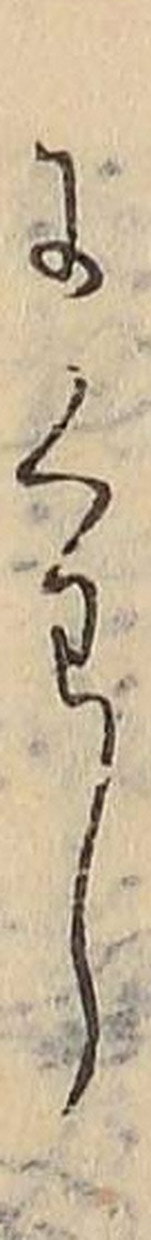にくわし
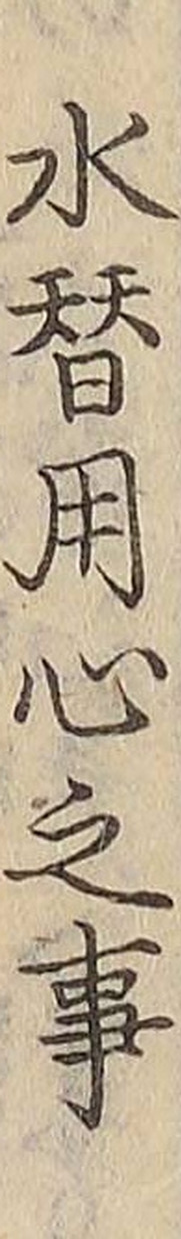水替用心之事
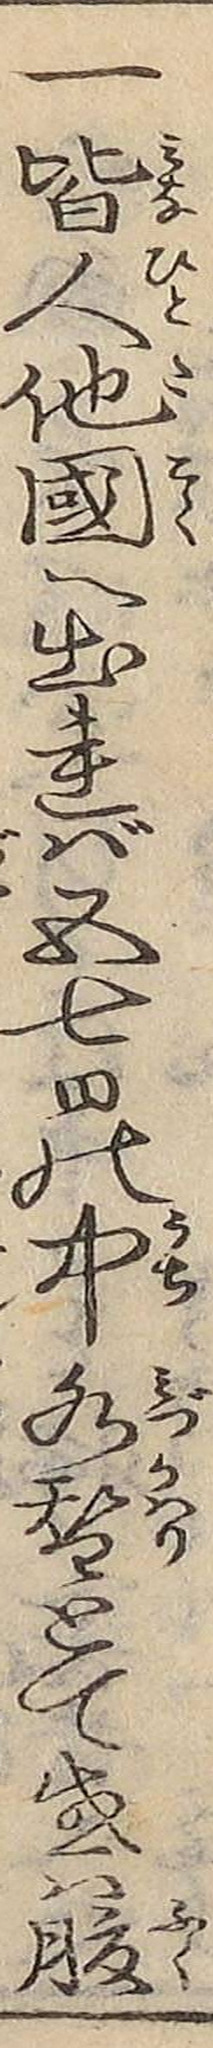一皆人他国へ出れば五七日の中水替とて或は腹
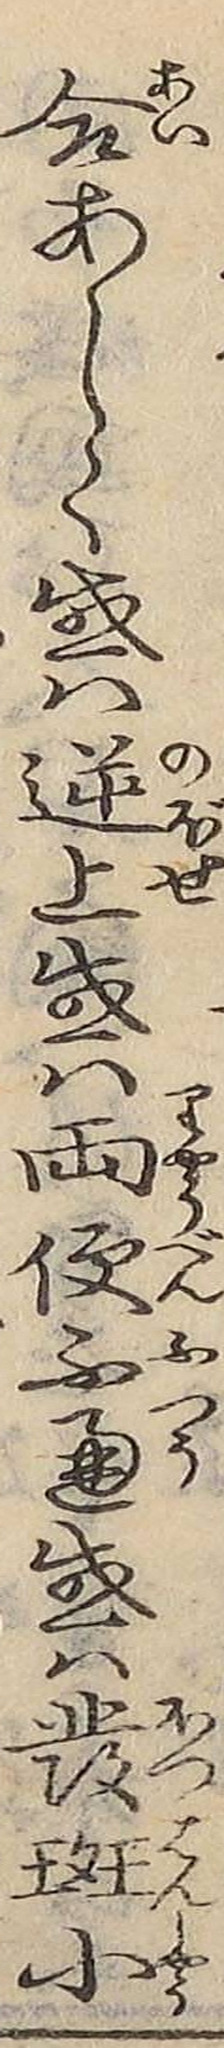合あしく或は逆上或は両便不通或は発斑小
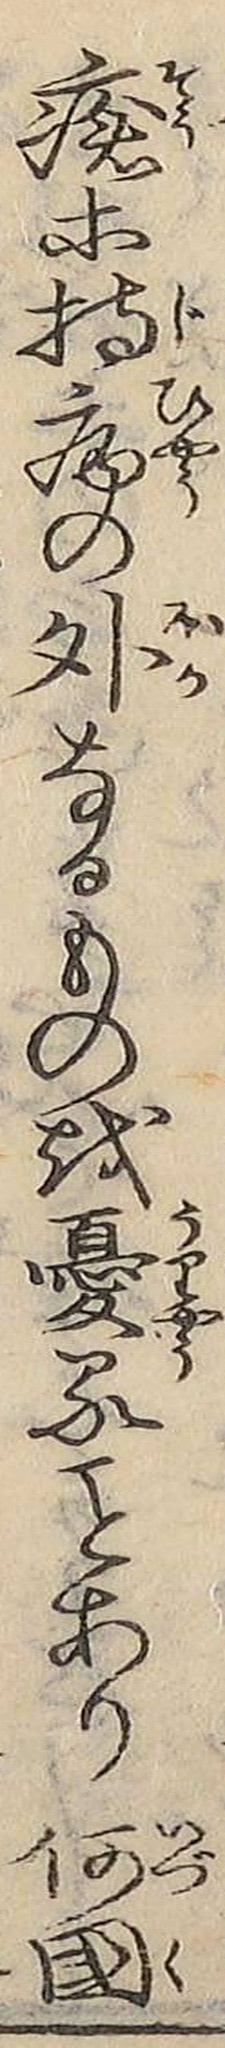瘡等持病の外なるものを憂ることあり何国
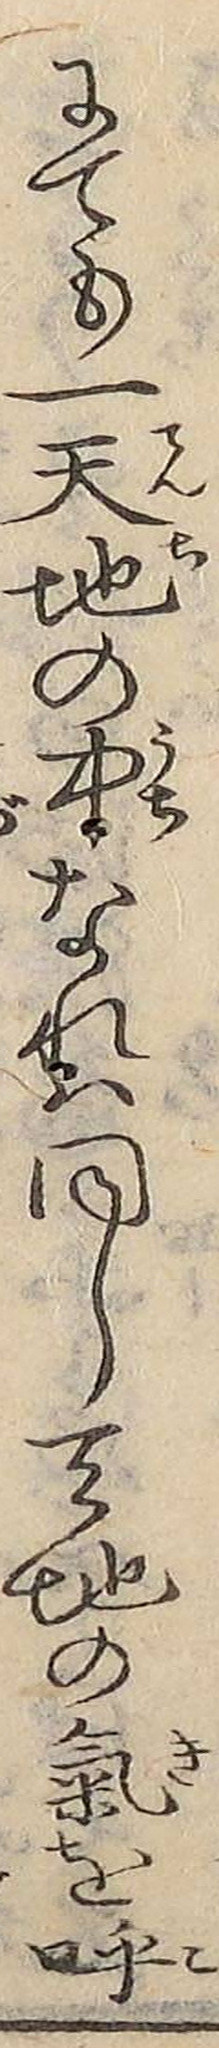にても一天地の中なれは同し天地の気を呼
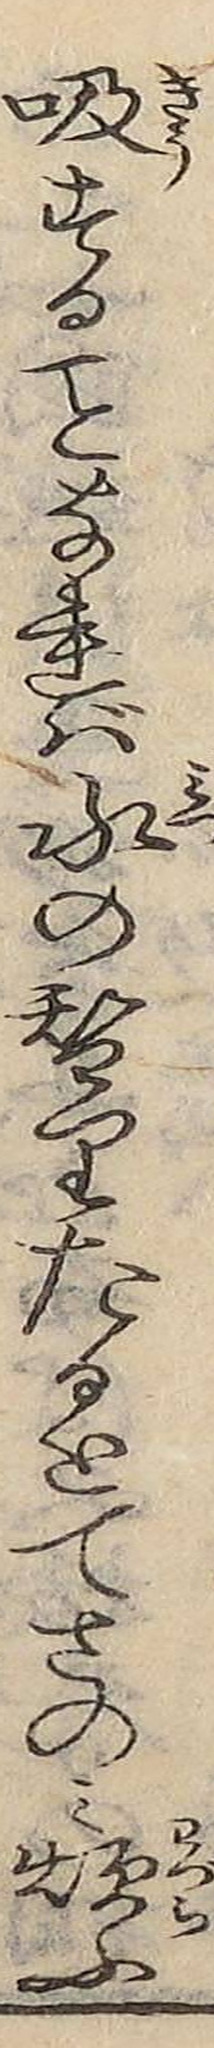吸することなれば水の替りたるとてさのみ煩ふ
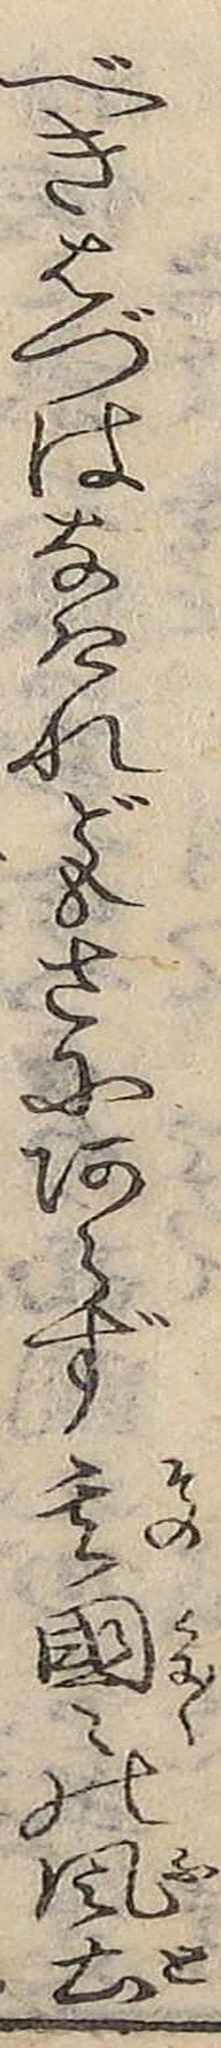べきはづはなけれどもさにあらず其国々の風土
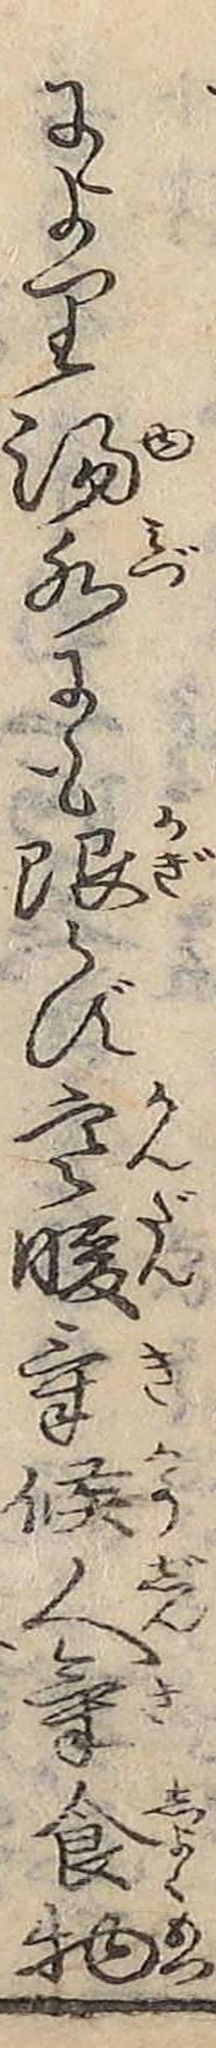により湯水にも限らず寒暖気候人気食物
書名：旅行用心集
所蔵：神戸大学附属図書館 国文学研究資料館
